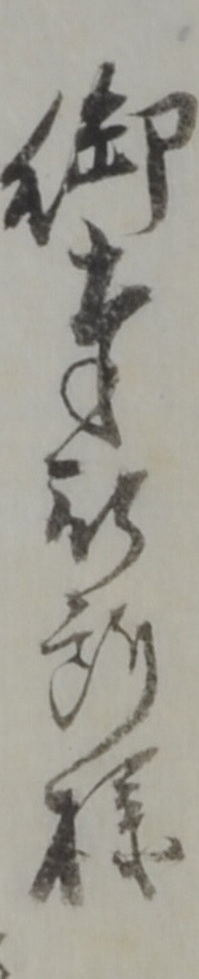御奉行所様

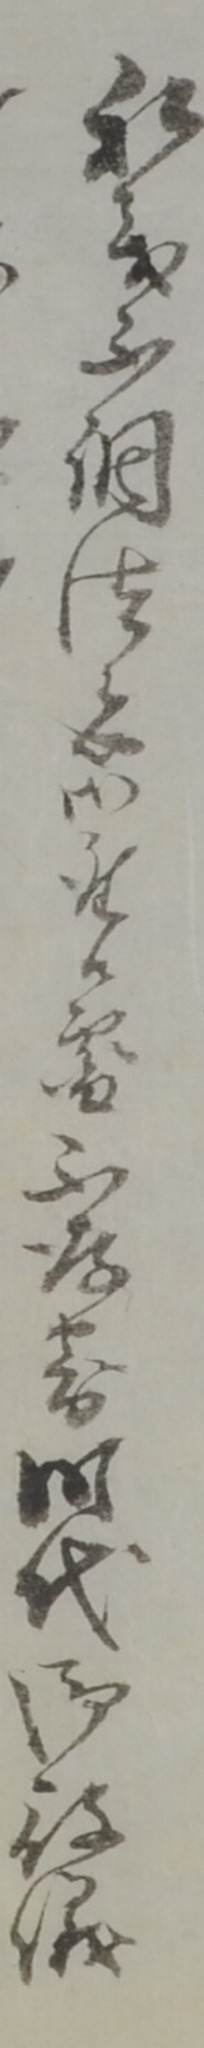私義不調法者御座候処不存寄町代御役儀
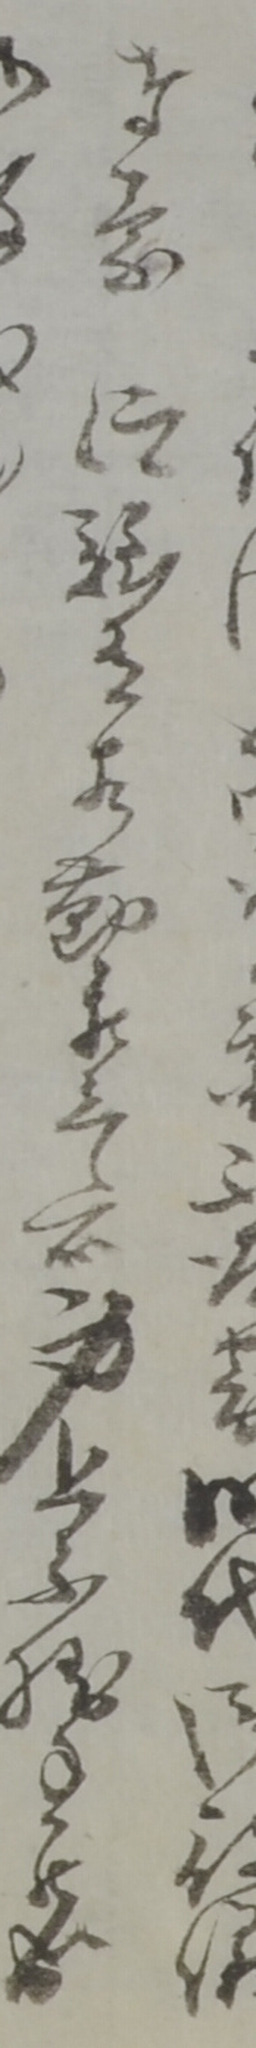奉蒙仰難有相勤罷有候所身上不勝手罷成
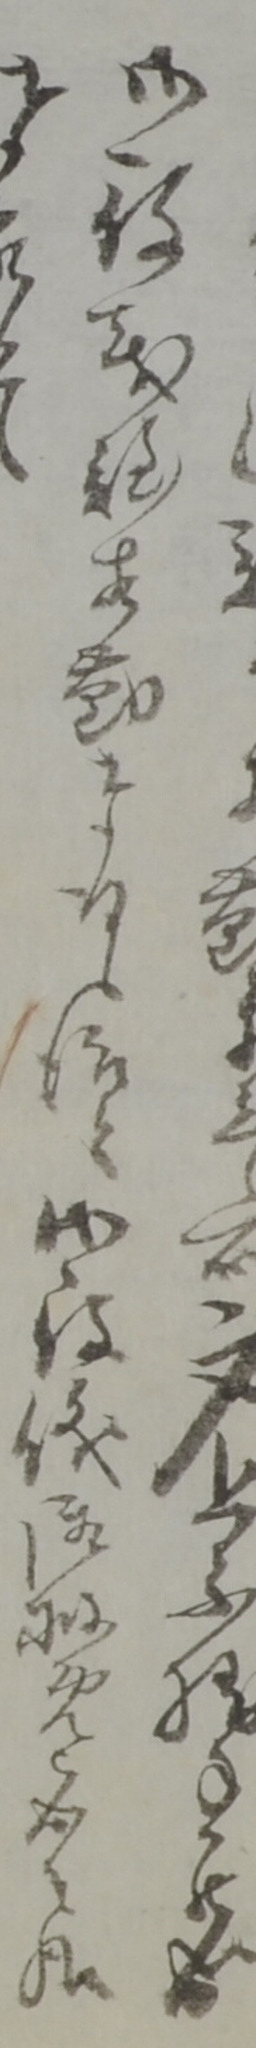御役義難相勤奉存候依之御役儀御赦免被成下候様
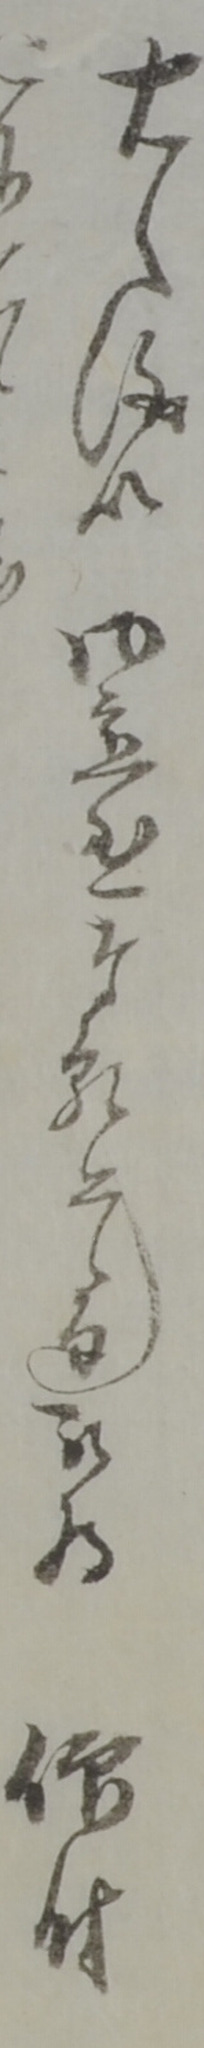右之趣以御慈悲奉願上候通被為仰付
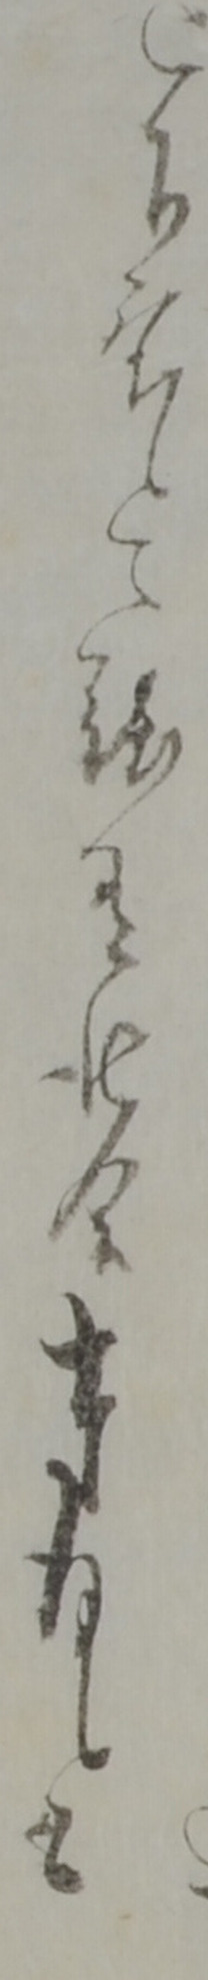被下置候ハヽ難有仕合奉存候以上
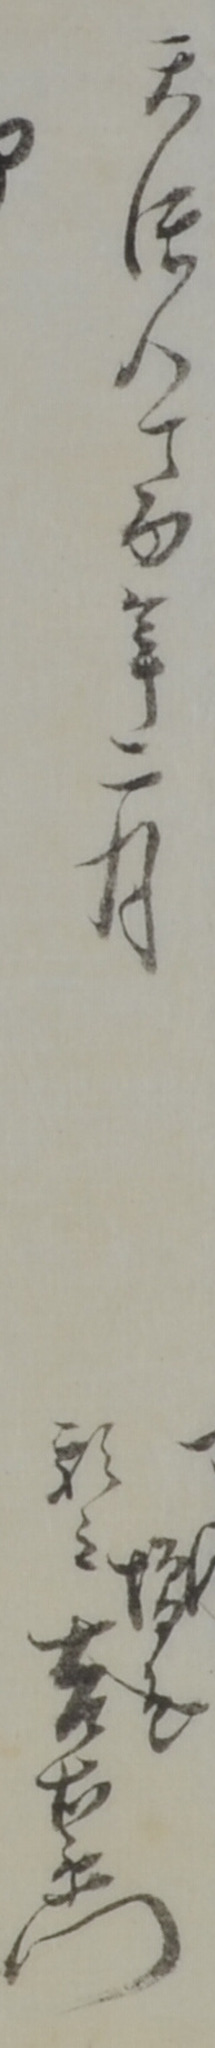天保八丁酉年二月願主吉右衛門
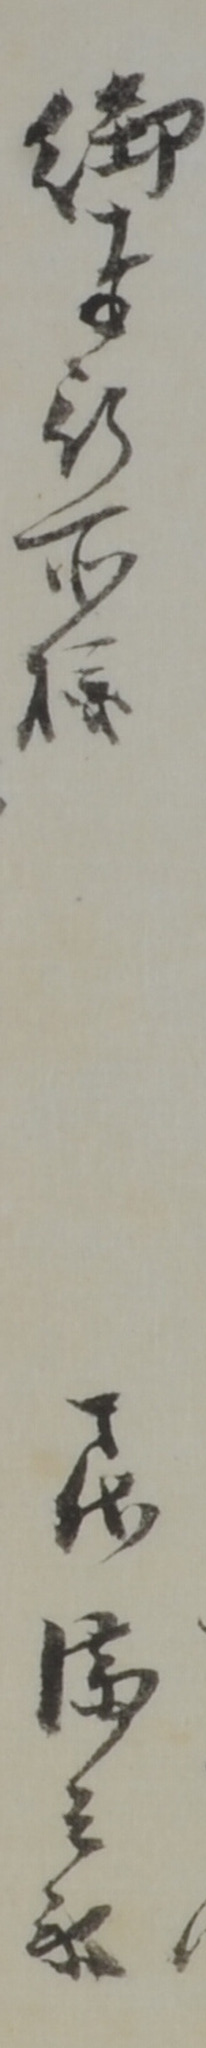御奉行所様町代満兵衛
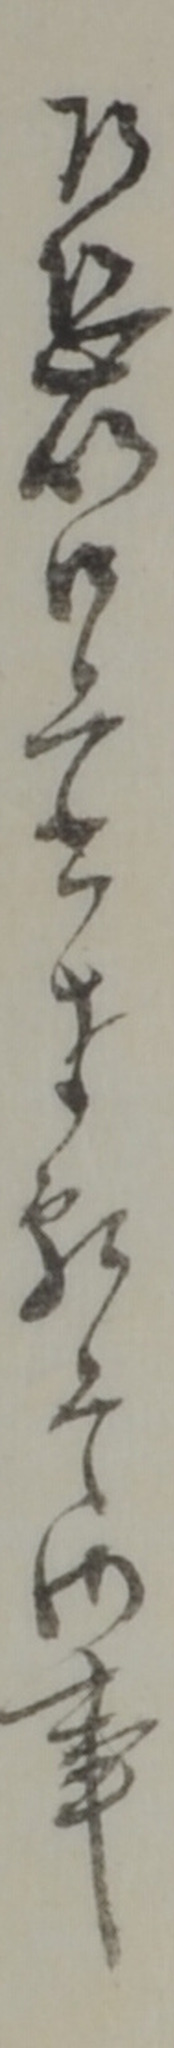乍恐以口上書奉願上候御事
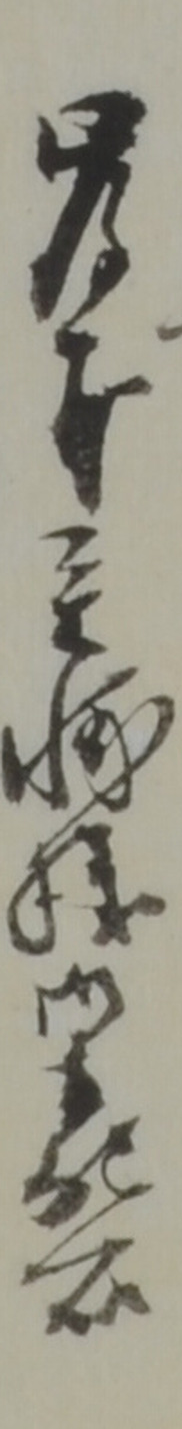岸本重輔様御支配所
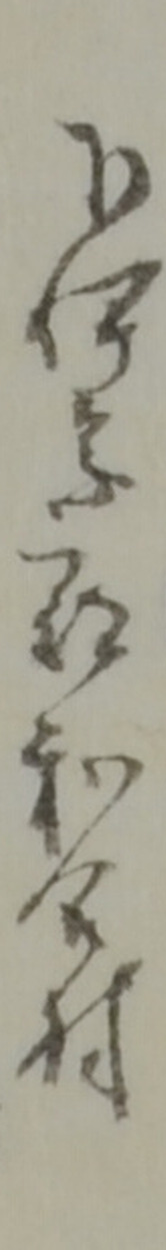下伊那郡和合村
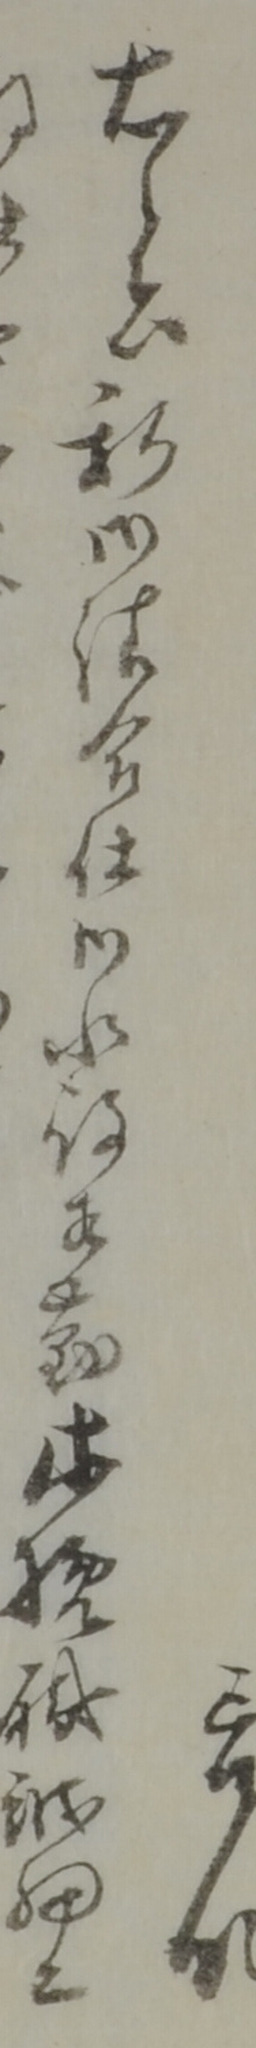右之者私御請合仕水役相勤木挽職越細工
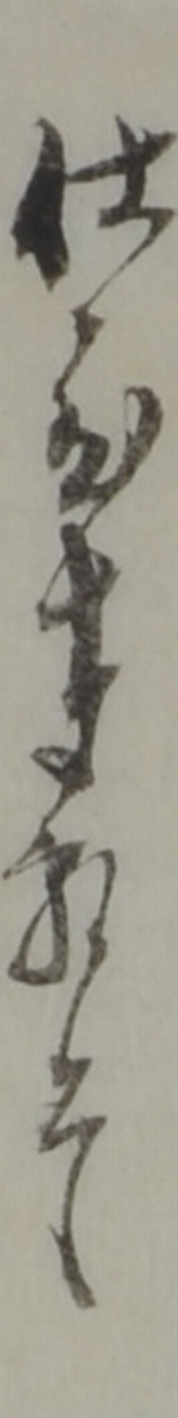仕度奉願上候
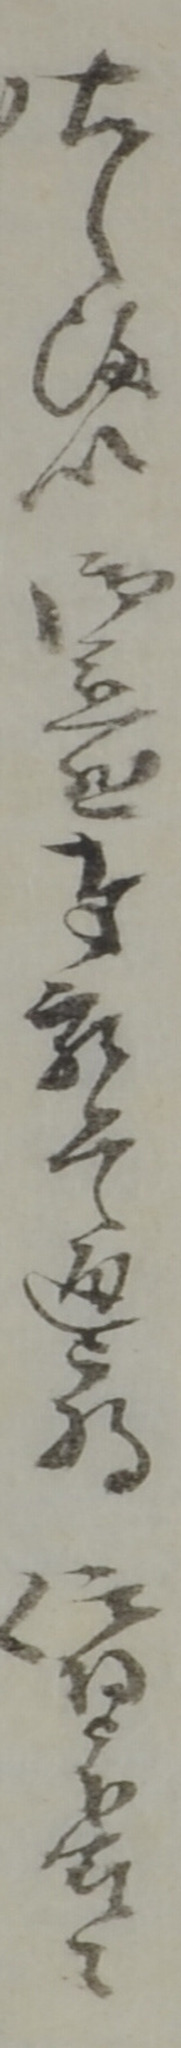右之趣以御慈悲奉願上候通被為仰付被下置候ハヽ
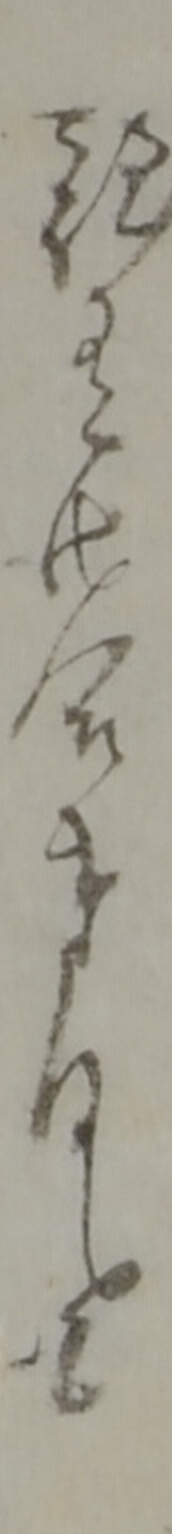難有仕合奉存候以上
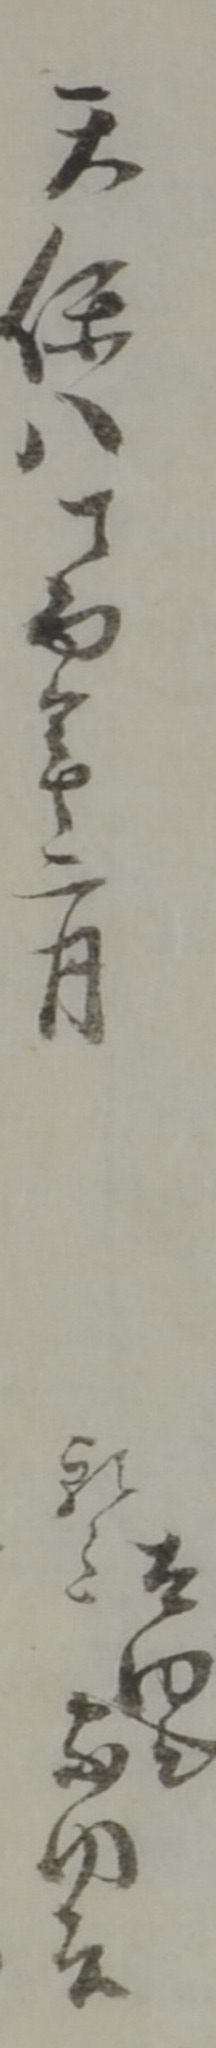天保八丁酉年二月願主家内者
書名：諸願書控帳
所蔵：伊那市立高遠町図書館・合同会社AMANE
